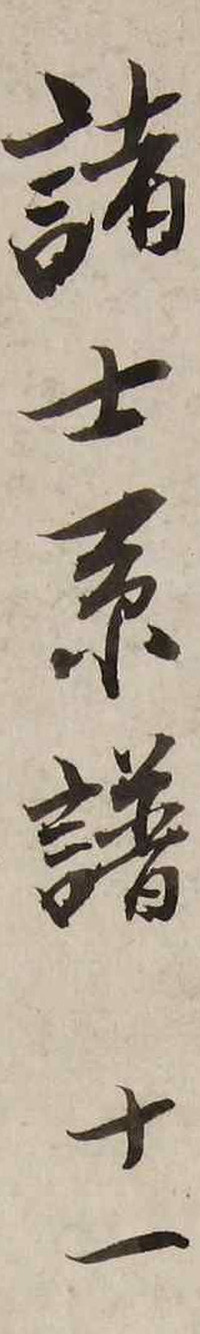】諸士系譜十一
